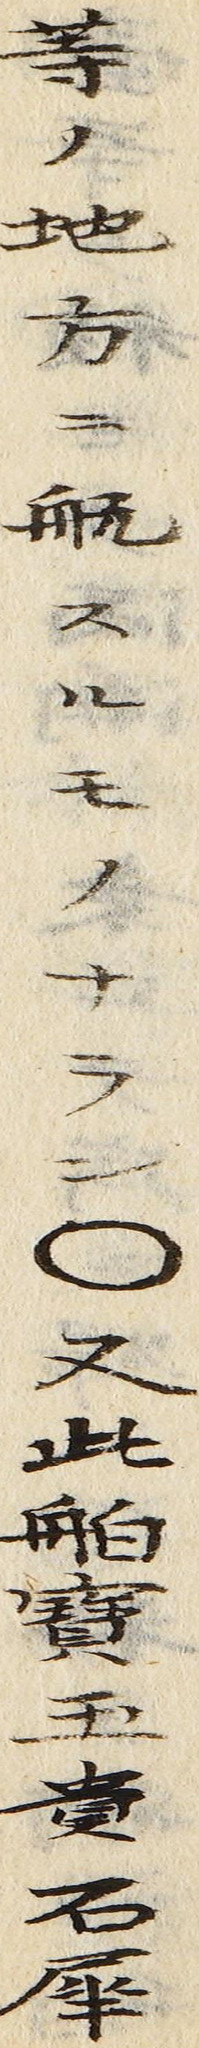等ノ地方ニ航スルモノナラン◯又此舶宝玉貴石犀
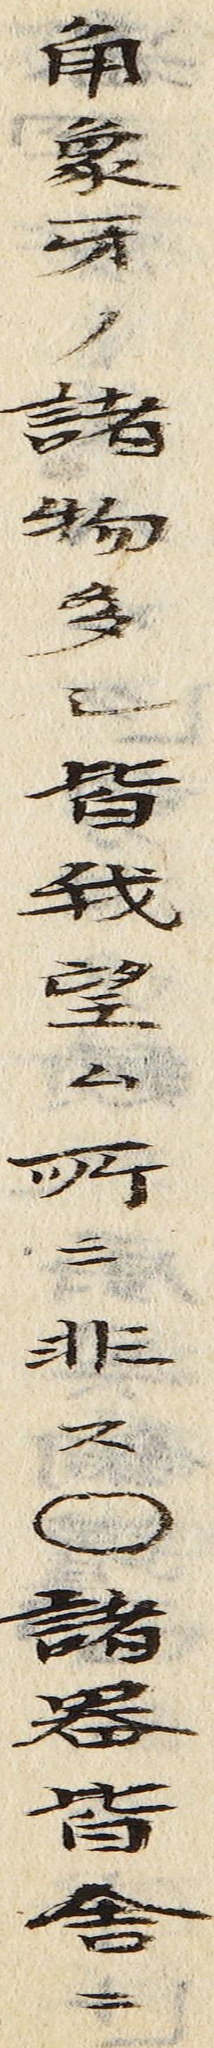角象牙ノ諸物多シ皆我望ム所ニ非ス◯諸器皆舎ニ
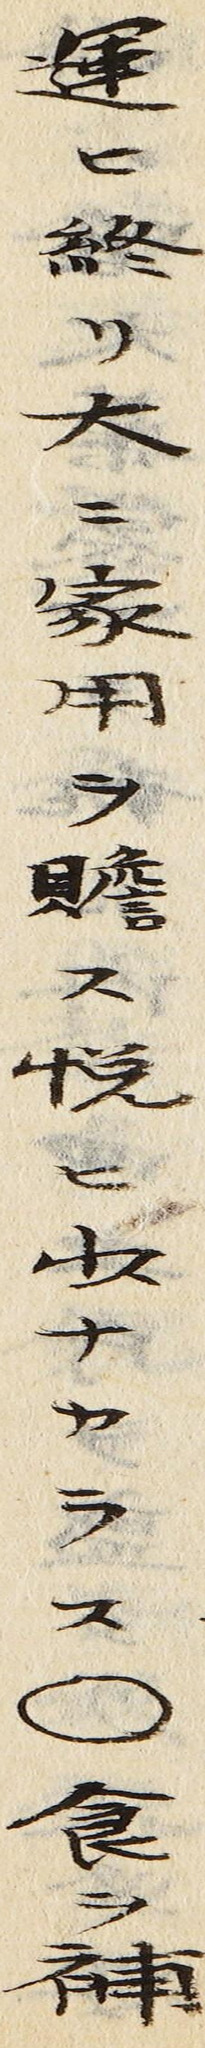運ヒ終リ大ニ家用ヲ贍ス悦ヒ少ナカラス◯食ヲ補
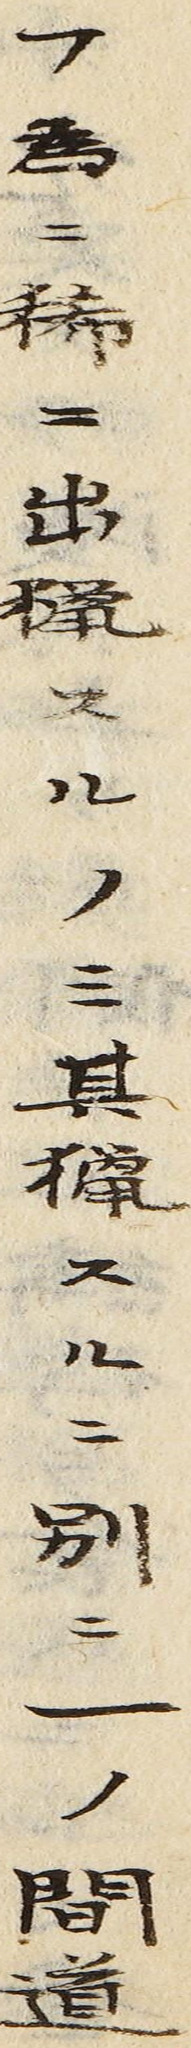フ為ニ稀ニ出猟スルノミ其猟スルニ別ニ一ノ間道
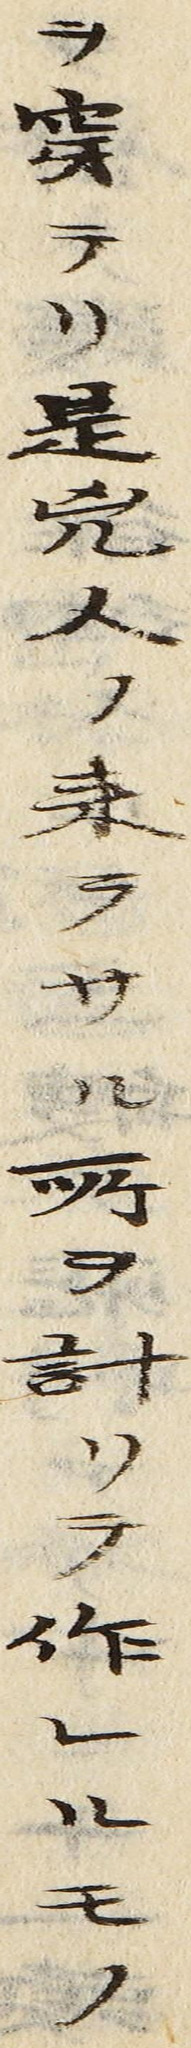ヲ穿テリ是兇人ノ来ラサル所ヲ計リテ作レルモノ
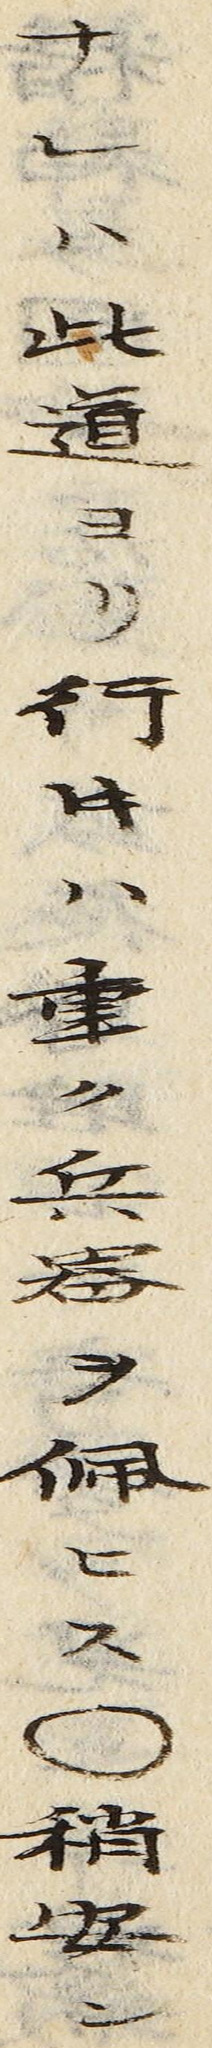ナレハ此道ヨリ行トキハ重ク兵器ヲ佩ヒス◯稍安ン
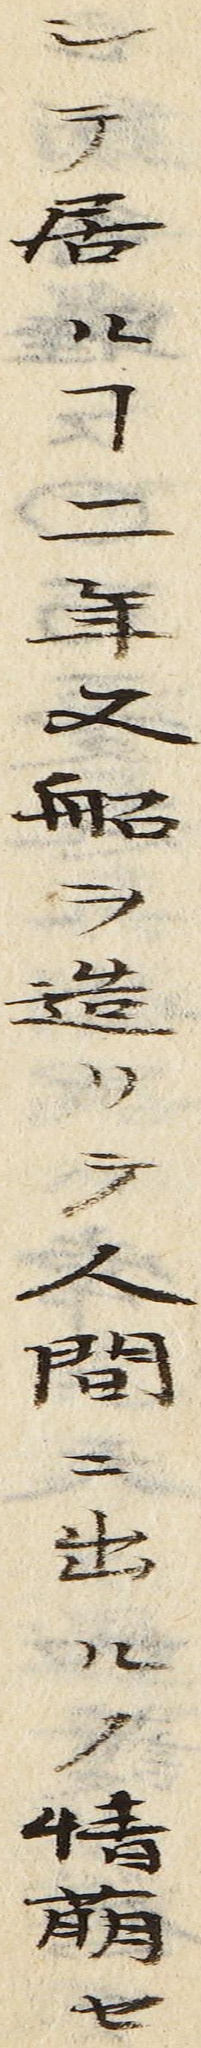シテ居ルコト二年又船ヲ造リテ人間ニ出ルノ情萌セ
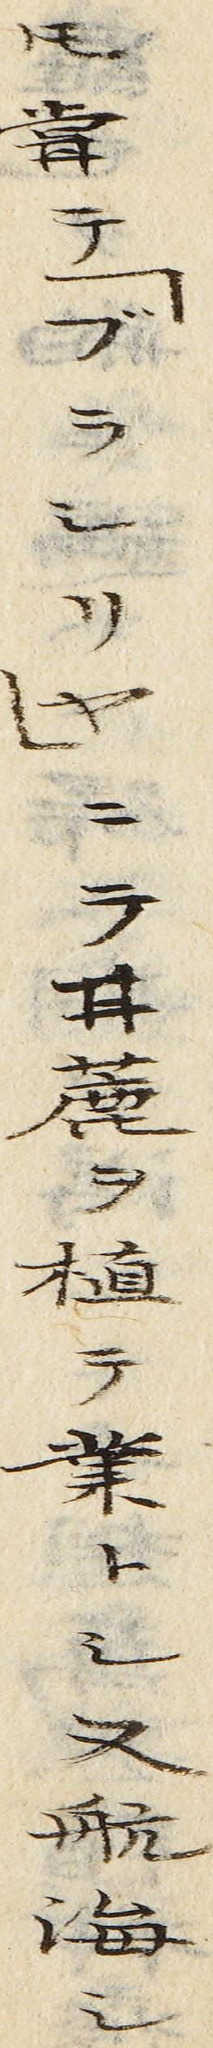トモ嘗テ「ブラシリヤ」ニテ其蔍ヲ植テ業トシ又航海シ
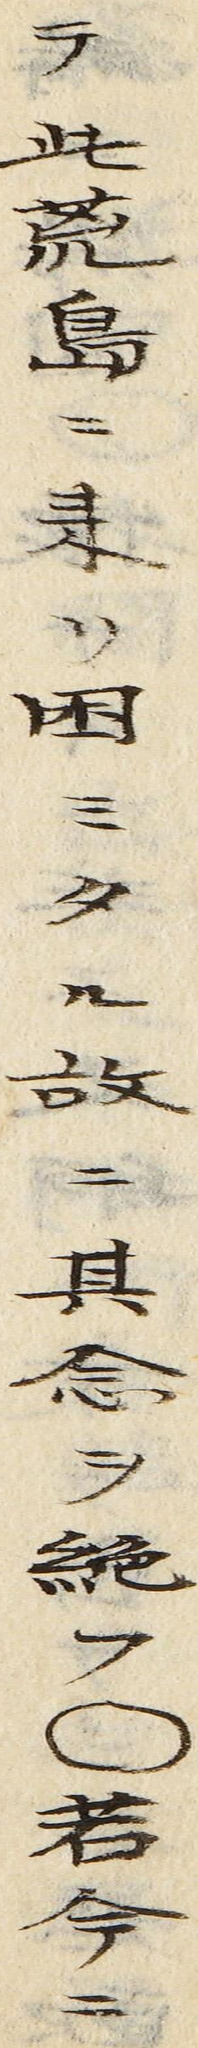テ此荒島ニ来リ困ミタル故ニ其念ヲ絶フ◯若今ニ
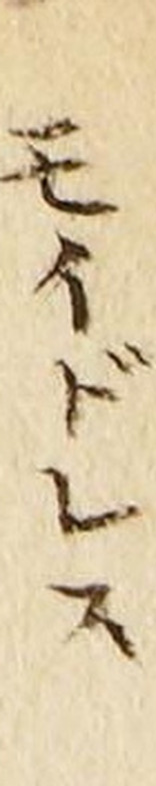モイドレス
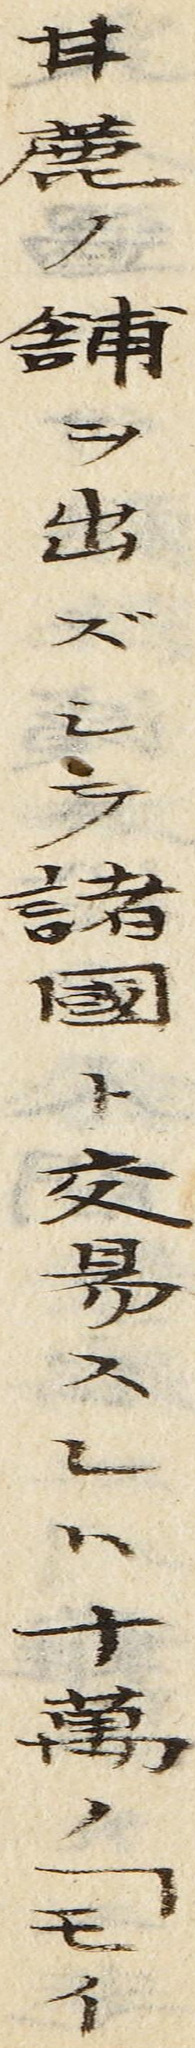其蔍ノ舗ヲ出ズシテ諸国ト交易スレハ十萬ノ「モイ
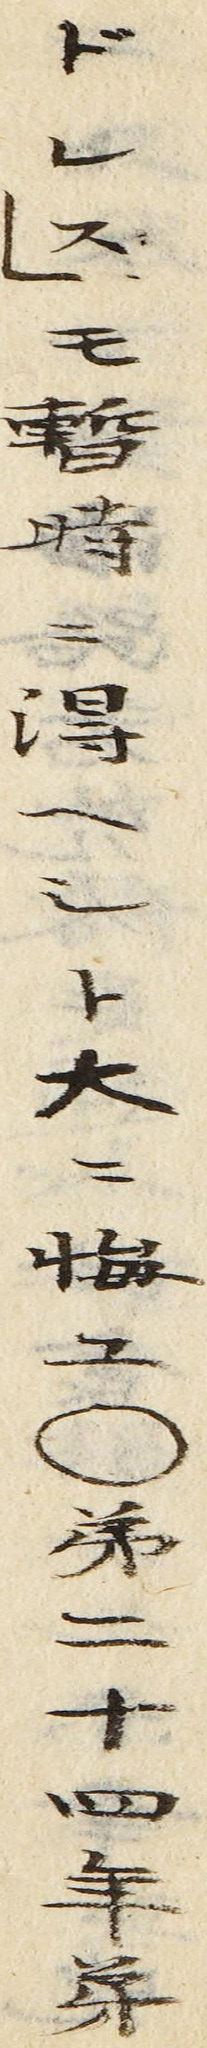ドレス」モ暫時ニ得ヘシト大ニ悔ユ◯第二十四年第
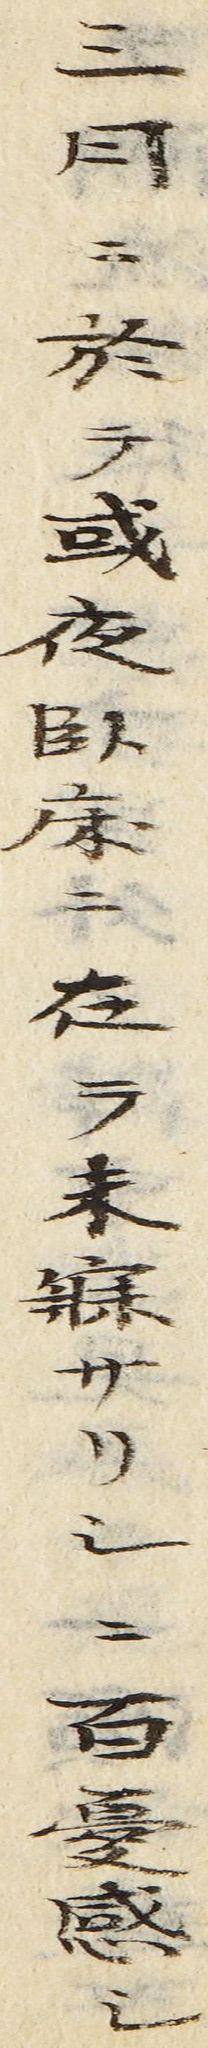三月ニ於テ或夜臥床ニ在テ未寐サリシニ百憂感シ
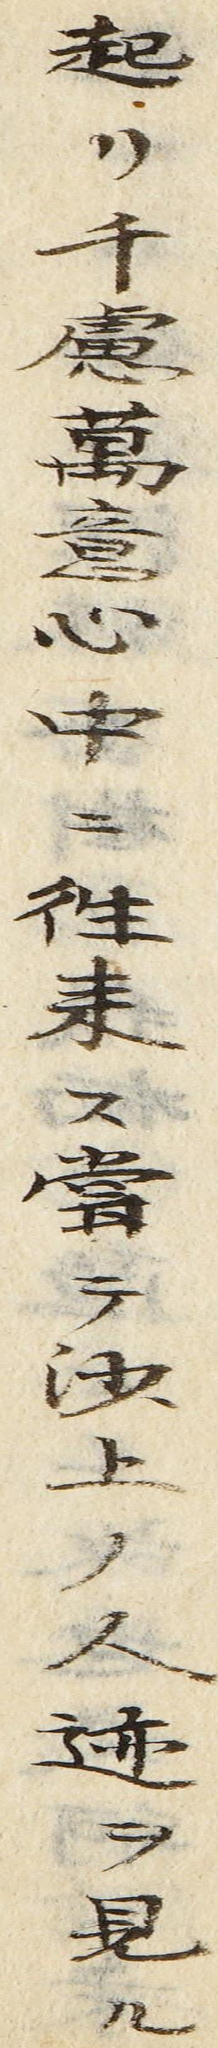起リ千慮萬意心中ニ往来ス嘗テ沙上ノ人迹ヲ見ル
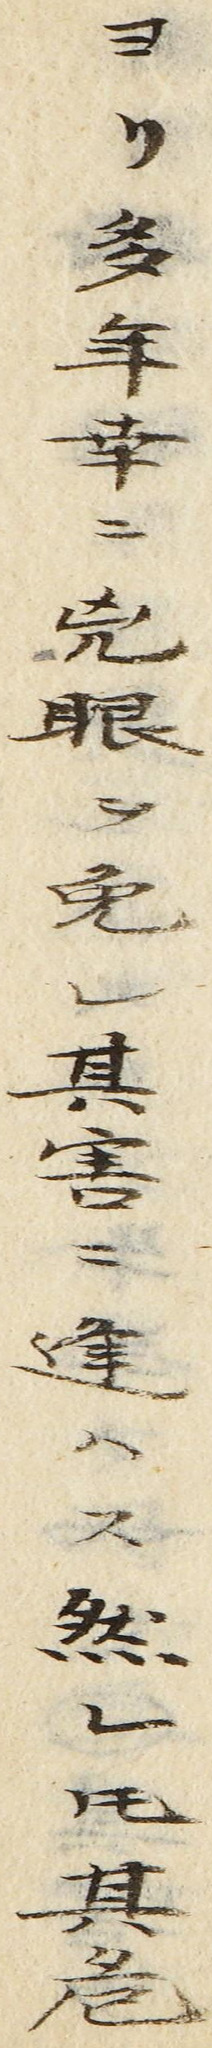ヨリ多年幸ニ兇眼ヲ免レ其害ニ逢ハス然レトモ其危

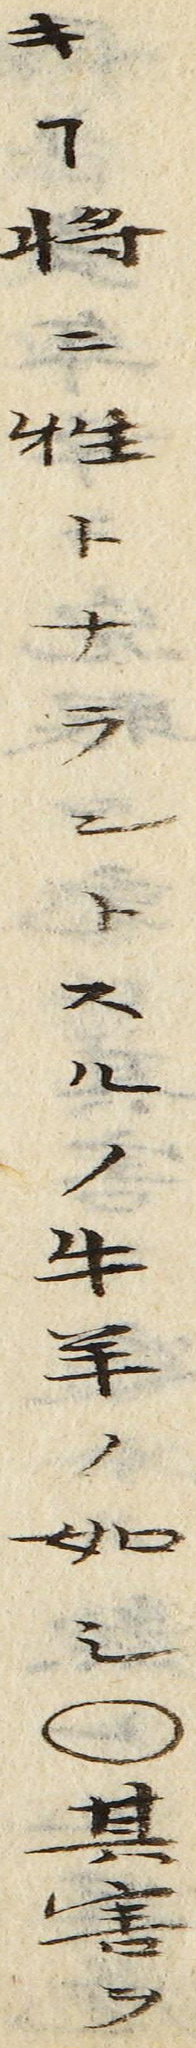キコト将ニ牲トナラントスルノ牛羊ノ如シ◯其害ヲ
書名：漂流紀事
